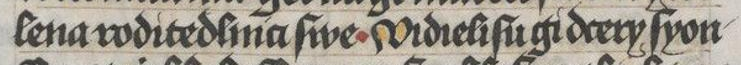lena roditedlnici ſwe.Vidieliſu gi dcery ſyon¬
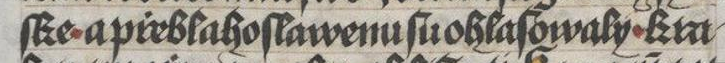ſke. a pṙeblahoſlawenu ſu ohlaſowaly.kra¬
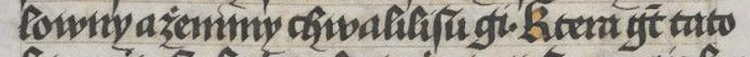lowny a żenimy chwaliliſu gi.Která ḡt tato
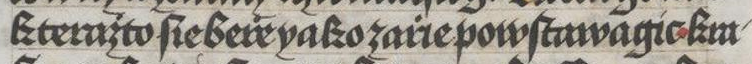kteráżto ſíebeṙe yako zaṙie powſtawagíc.kra¬
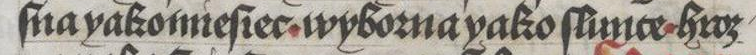ſna yakomíeſiec. wyborna yako ſlunce.hroz¬
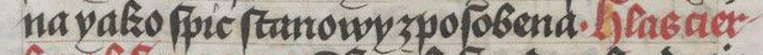na yako ſpic ſtanowy zpoſobena.Hlas cier¬
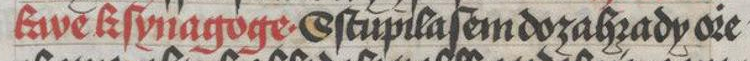kwe kſynagoge. Sſtupilaſem dozahrady oṙe¬
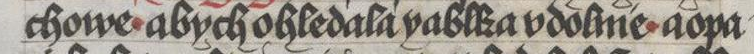chowe.abych ohledala yablka vdolníe.aopa¬
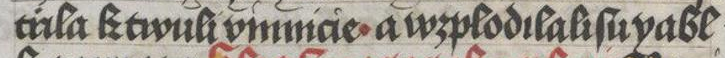tṙila k twuli vinnicie.a wzplodilali ſu yabl¬
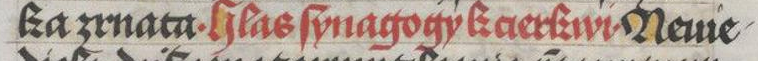ka zrnata.Hlas ſynagogy k cierkwi.Neuie¬
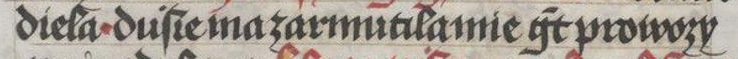diela.duẛie ma zarmutila mie ḡt prowozy
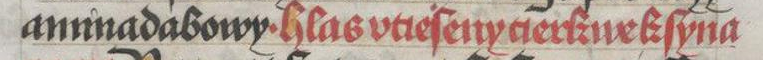aminadabowy. Hlas vtieẛeny cierkwe kſyna
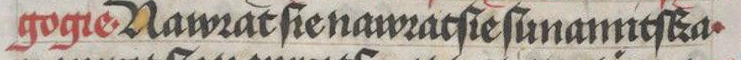gogie. Nawrat ſie nawratſie ſunamitſka.
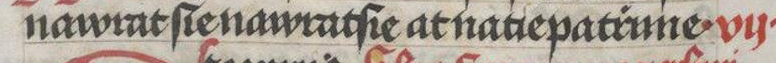nawrat ſie nawratſie at na tiepatṙime.vij.
